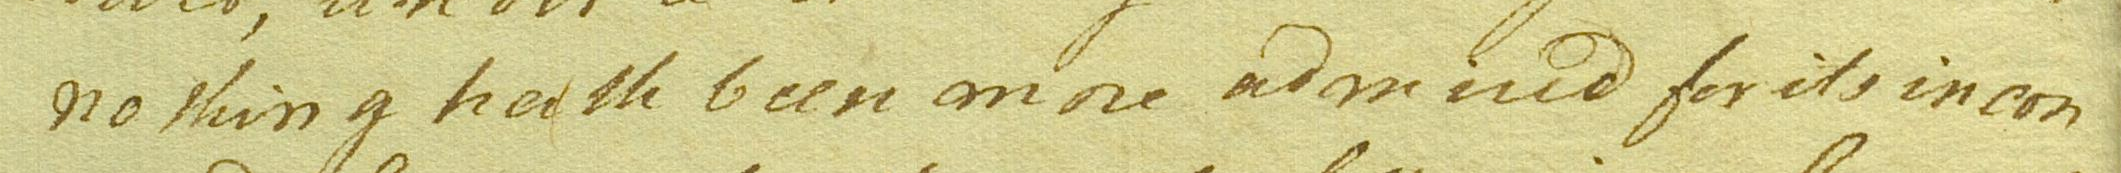nothing hath been more admired for its incon
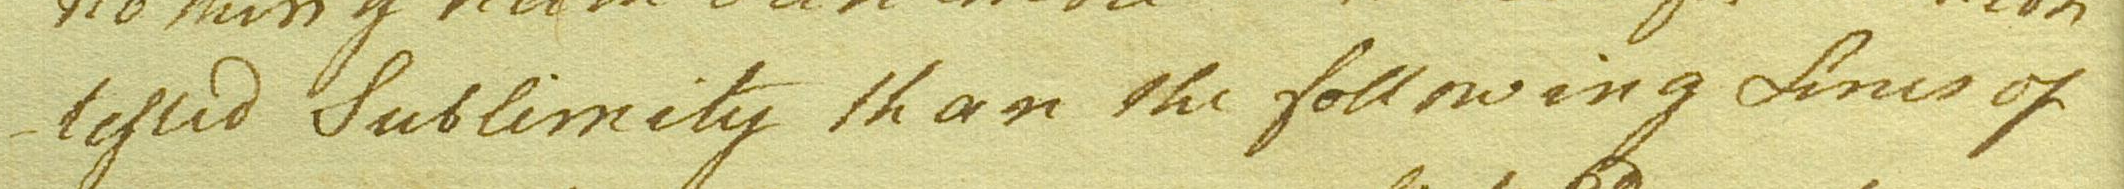-tested Sublimity than the following Lines of
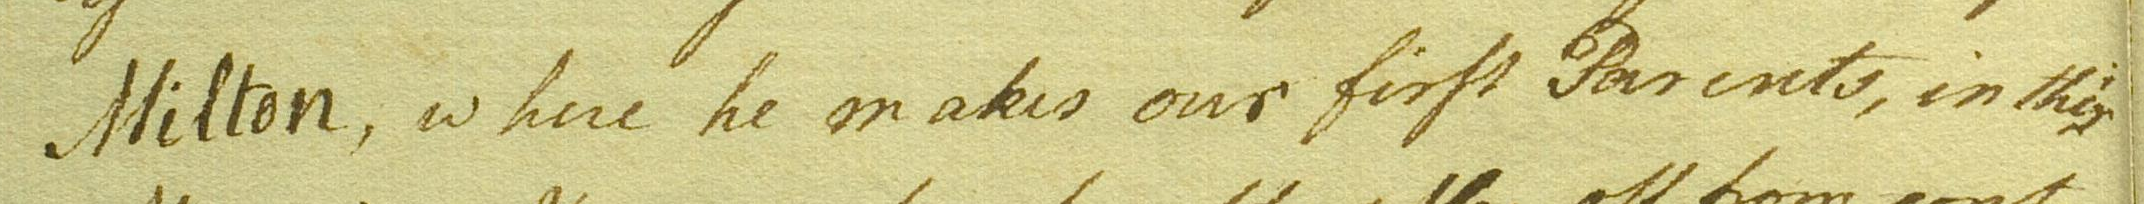Milton, where he makes our first Parents, in the
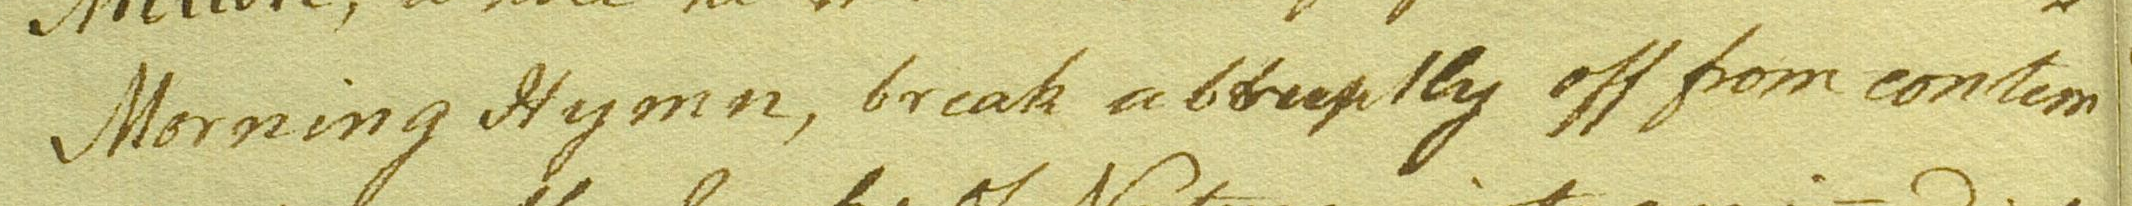Morning Hymn, break abruptly off from contem
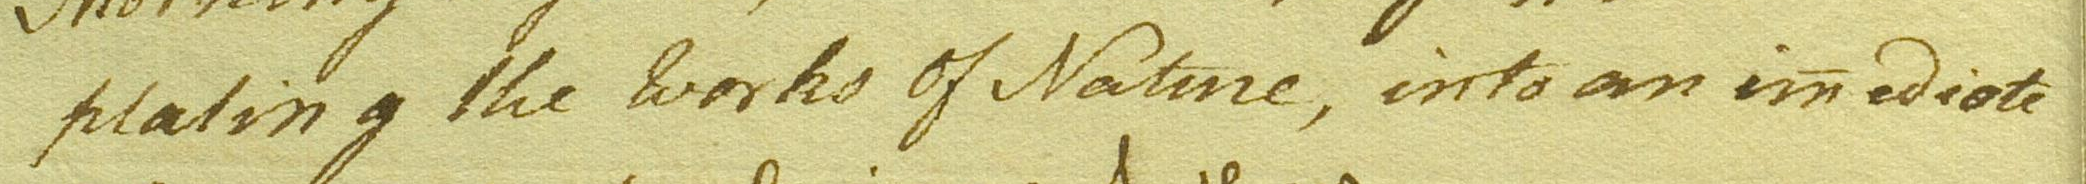plating the works of Nature, into an im̄ediate
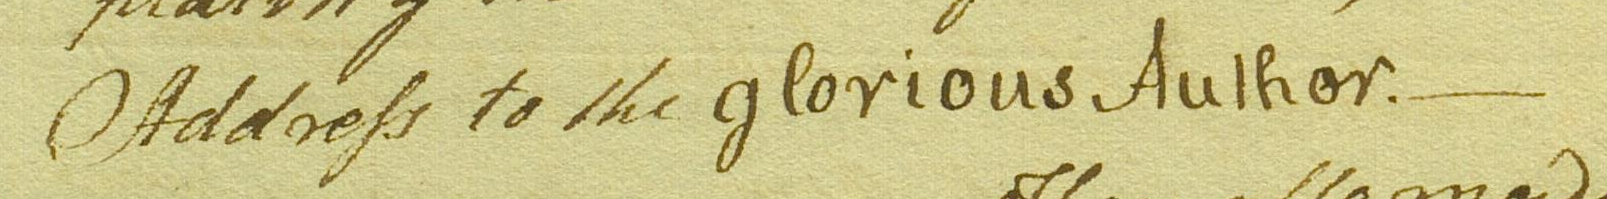Address to the glorious Author.-
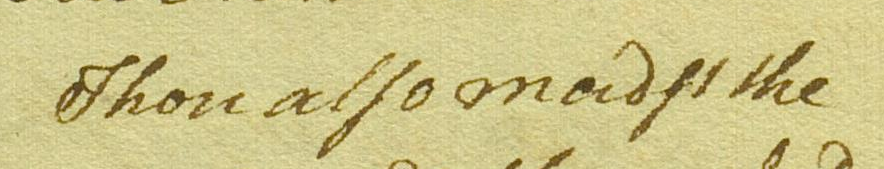Thou also madst the
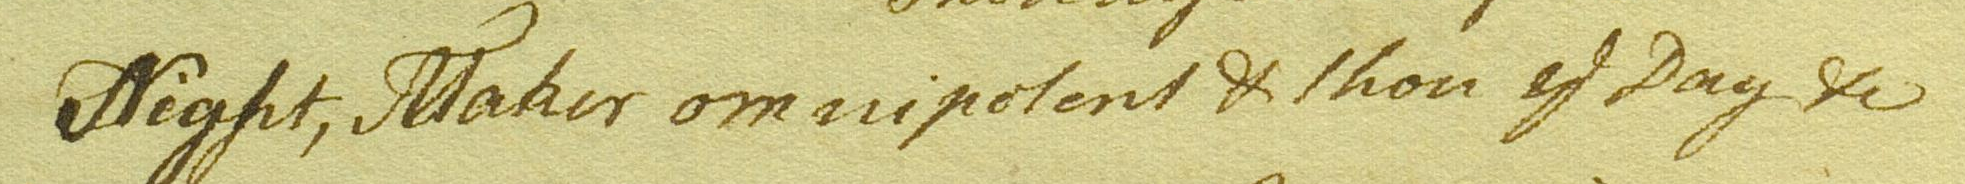Night, Maker omnipotent & thou ye Day &
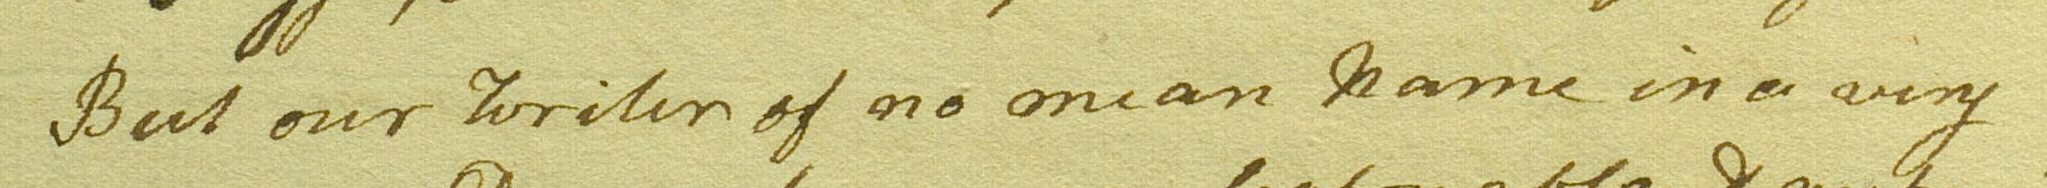But our Writer of no mean name in a very
